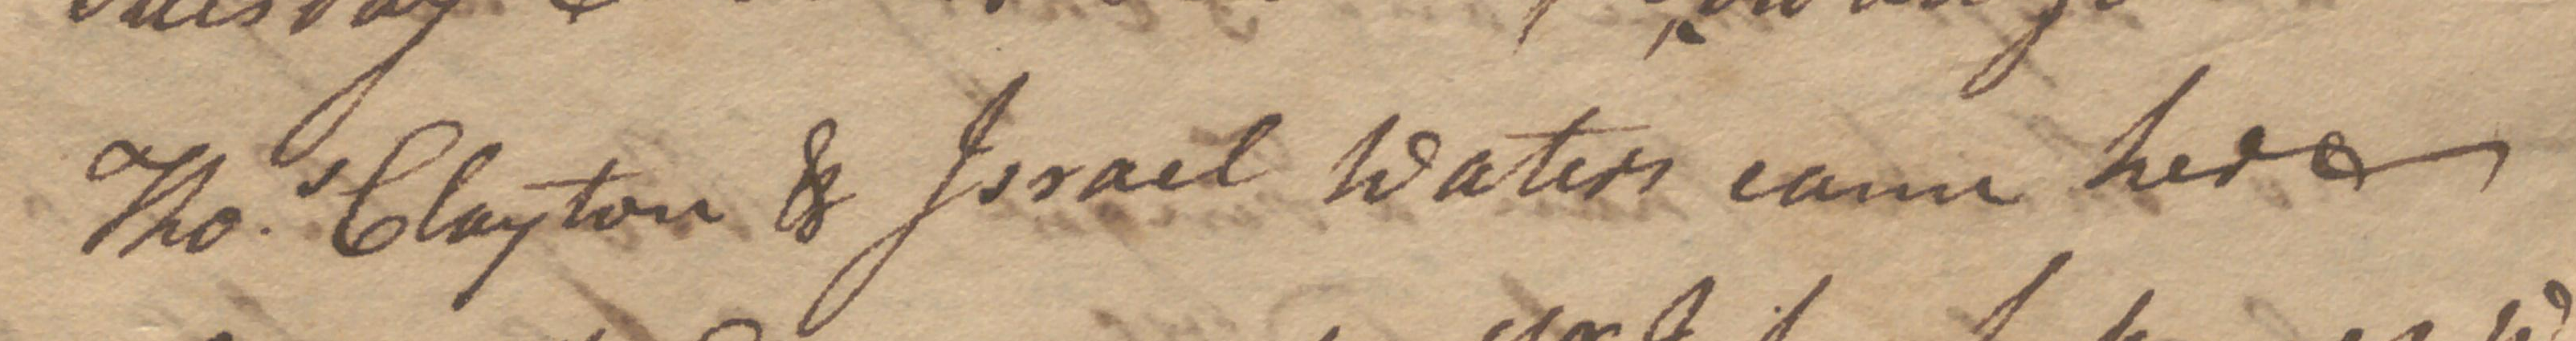Tho^s. Clayton & Israel Waters came here
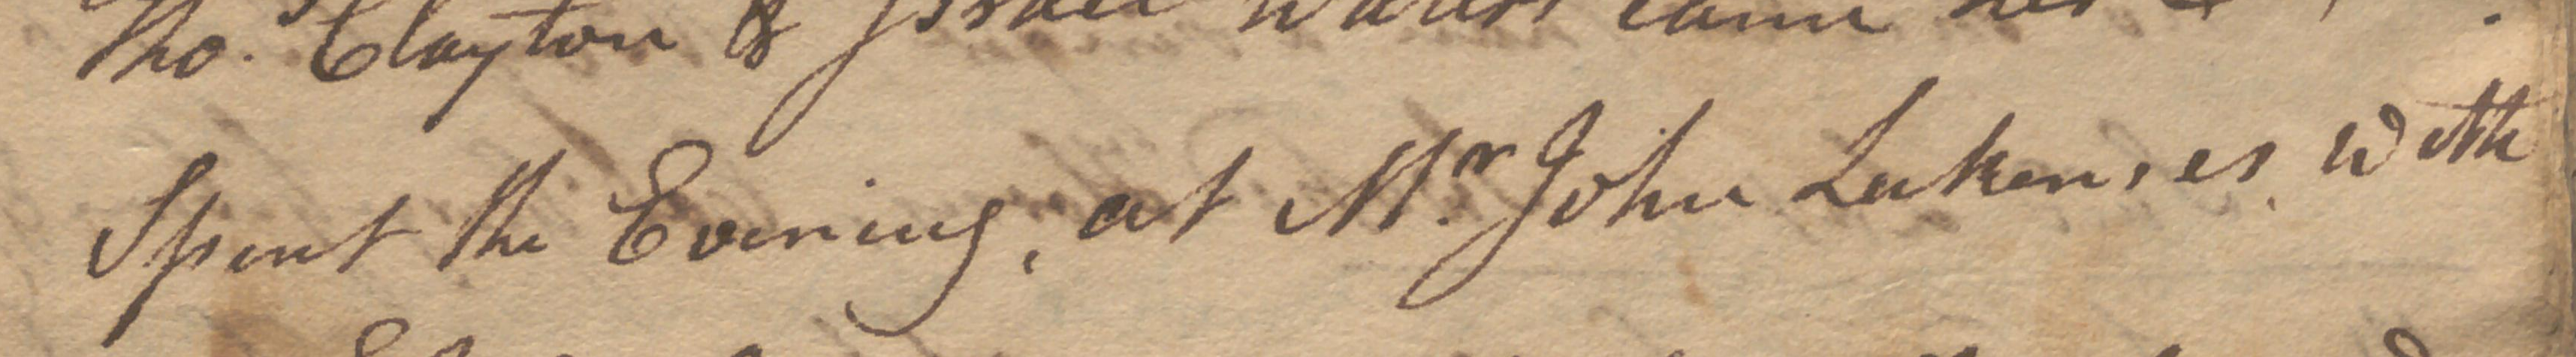Issent the Evening at M^r. John Lukenses with
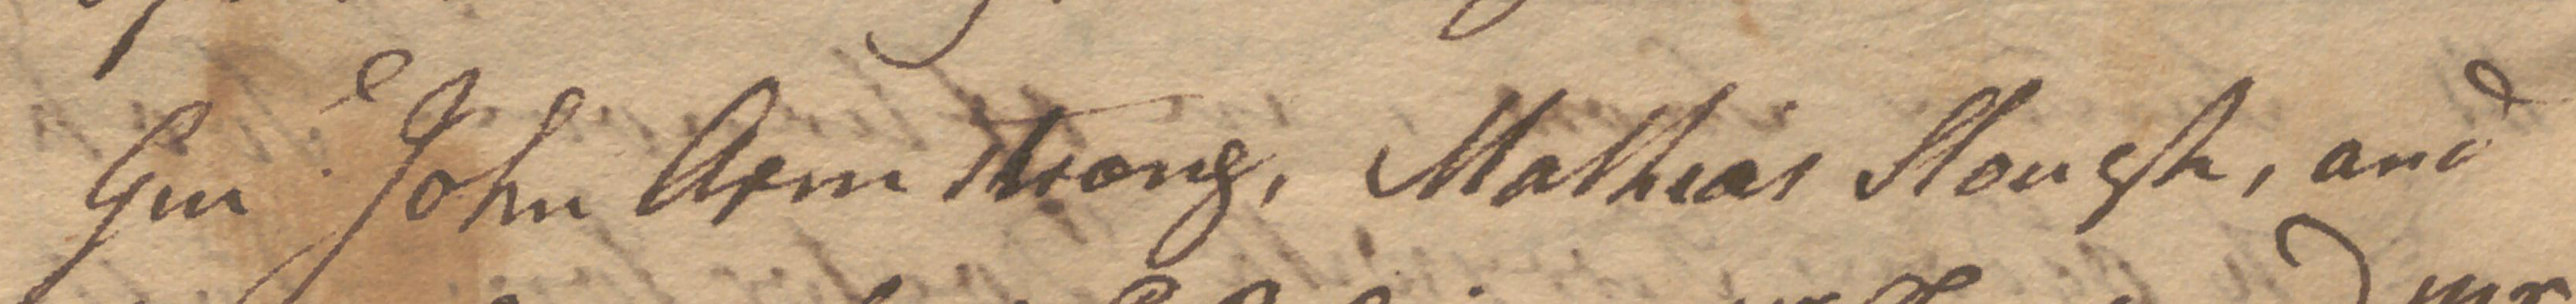Gen^l. John Armstong, Mathias Slough, and
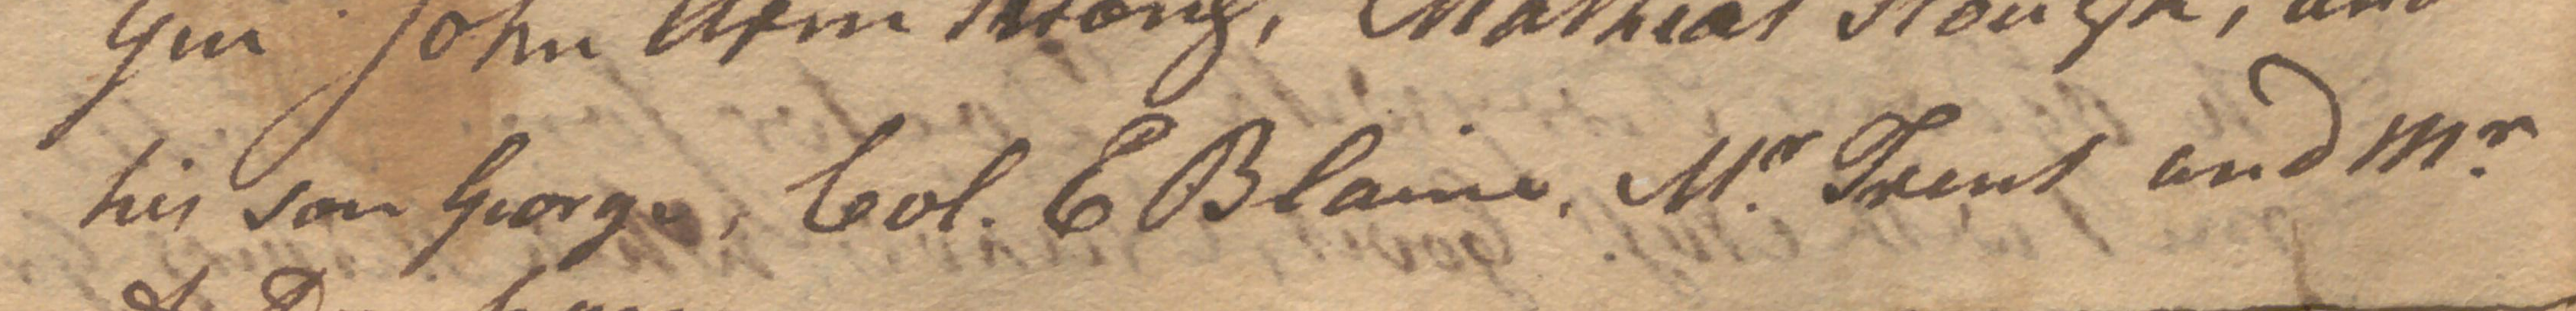his sor George, Col. E Blaine, M^r. Trent and M^r.
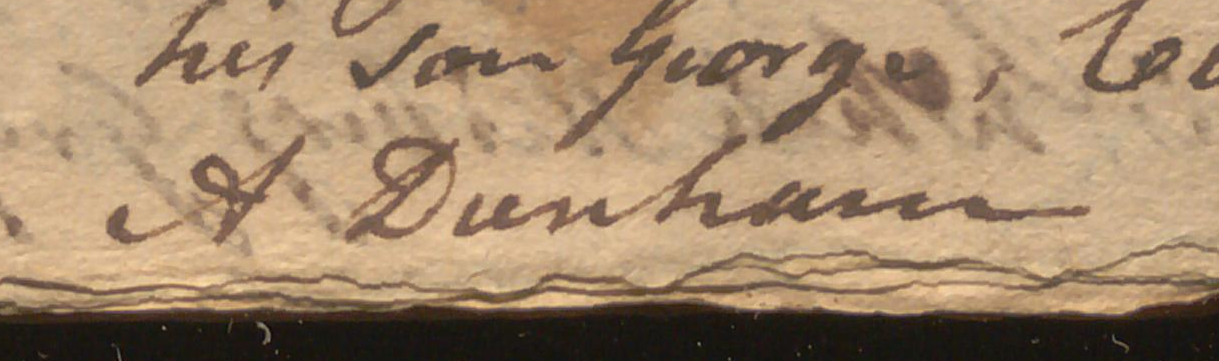A Dunham
